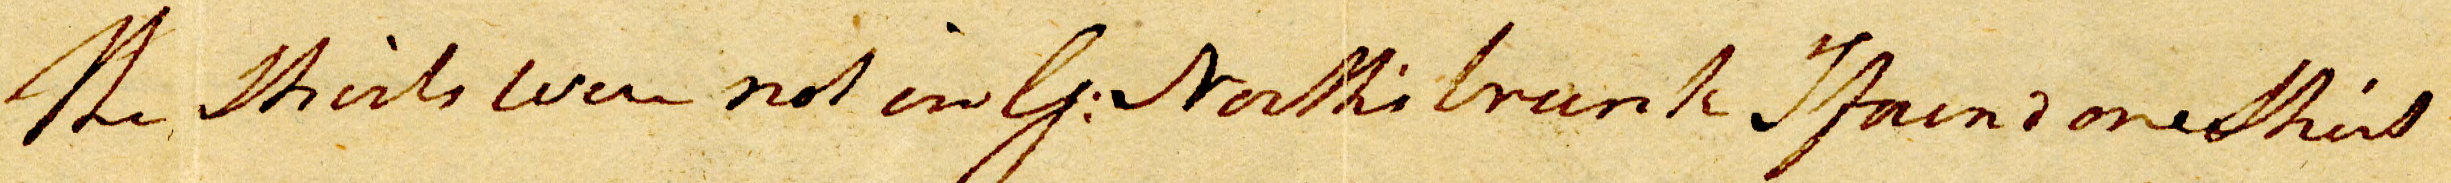The shirts were not in G: North's trunk I found one shirt
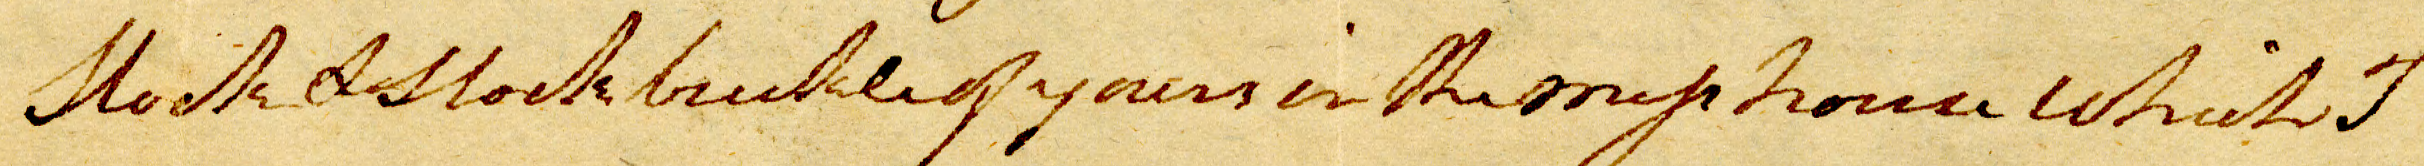Stock & stock buckle of yours in the mess house which I
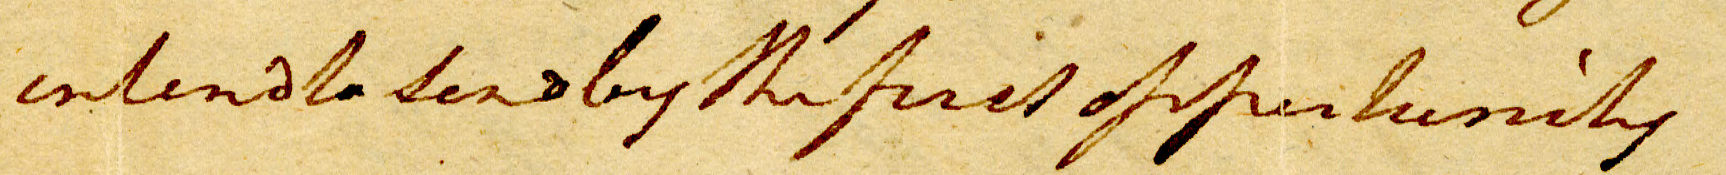intend to send by the first opportunity.
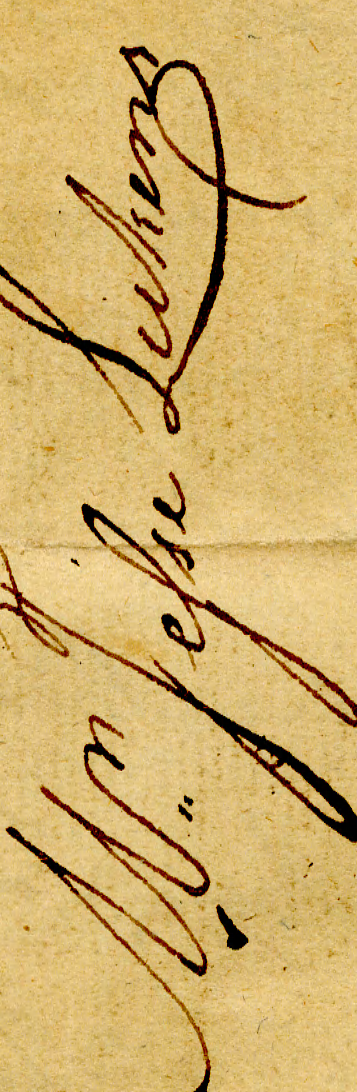M^r. Jesse Lukens
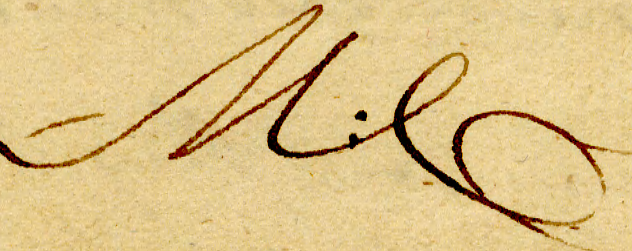M:C
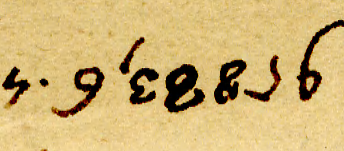95883,6.4
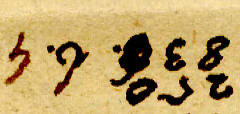836.6.4
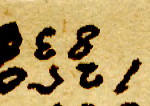1250
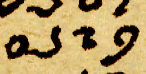6250
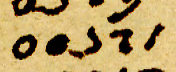12500
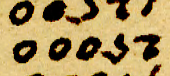25000
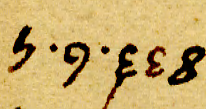833.6.4
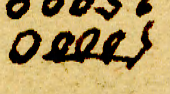50000
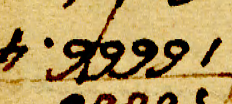16666.4
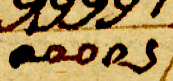50000
